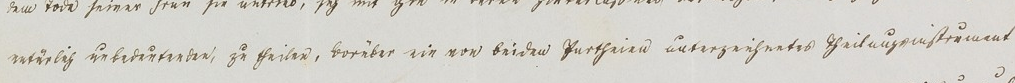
natürlich unbedeutenden, zu theilen, worüber ein von beiden Partheien unterzeichnetes Theilungsinstrument
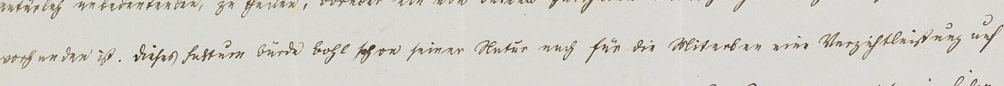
vorhanden ist. Dieses Faktum würde wohl schon seiner Natur nach für die Miterben eine Verzichtleistung auf
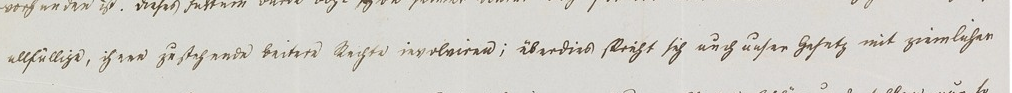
allfällige, ihnen zustehende weitere Rechte involviren; überdies spricht sich auch unser Gesetz mit ziemlicher
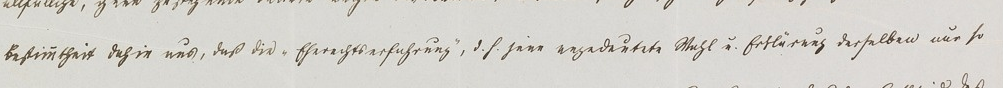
Bestimmtheit dahin aus, daß die «Eherechtserfahrung», d. h. jene angedeutete Wahl u. Erklärung derselben nur so
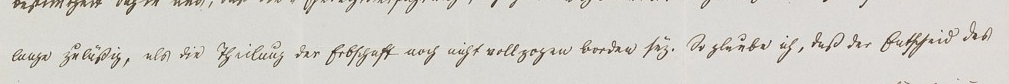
lange zuläßig, als die Theilung der Erbschaft noch nicht vollzogen worden sey. So glaube ich, daß der Entscheid des
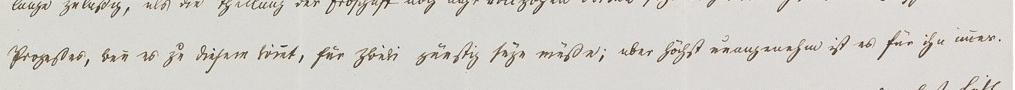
Prozesses, wenn es zu diesem kömmt, für Zwicki günstig seyn müsse; aber höchst unangenehm ist es für ihn immer-
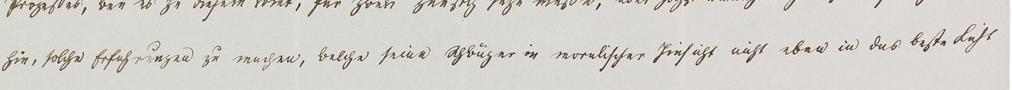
hin, solche Erfahrungen zu machen, welche seine Schwäger in moralischer Hinsicht nicht eben in das beste Licht
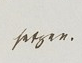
setzen.
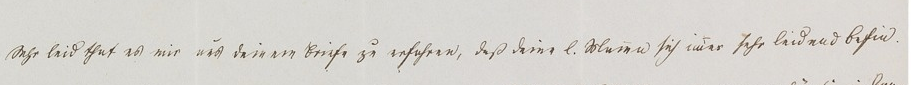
Sehr leid thut es mir aus Deinem Briefe zu erfahren, daß Deine l. Mamma sich immer sehr leidend befin-
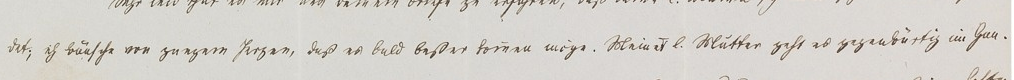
det; ich wünsche von ganzem Herzen, daß es bald besser kommen möge. Meiner l. Mutter geht es gegenwärtig im Gan-
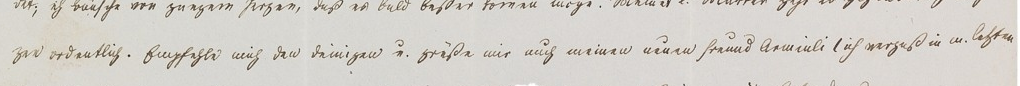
zen ordentlich. Empfehle mich den Deinigen u. grüße mir auch meinen neuen Freund Arminli (ich vergaß in m. letzten
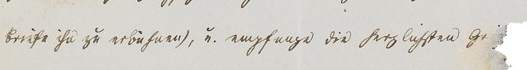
Briefe ihn zu erwähnen), u. empfange die herzlichsten Grüße von
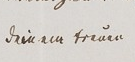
Deinem treuen
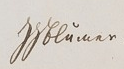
J Blumer.
